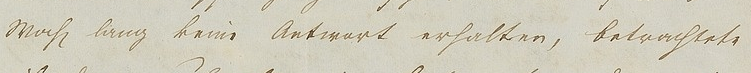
Wochen lang keine Antwort erhalten, betrachtete
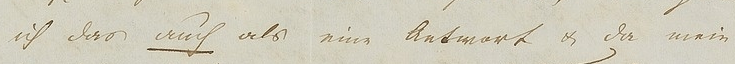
ich das auch als eine Antwort & da mein
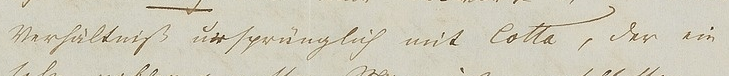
Verhältniß ursprünglich mit Cotta, der ein
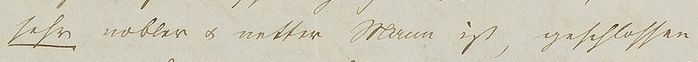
sehr nobler & netter Mann ist, geschlossen
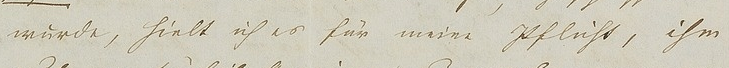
wurde, hielt ich es für meine Pflicht, ihm
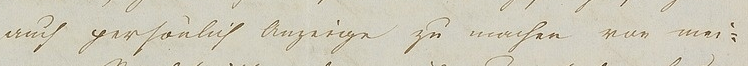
auch persönlich Anzeige zu machen von mei-
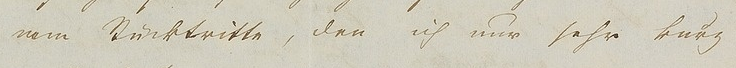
nem Rücktritte, den ich nur sehr kurz
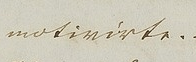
motivirte. –
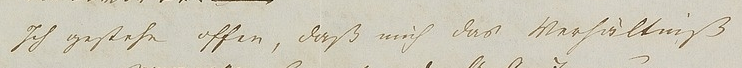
Ich gestehe offen, daß mich das Verhältniß
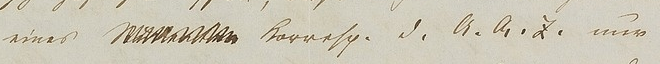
einesKorresp. d. A.A.Z. nur
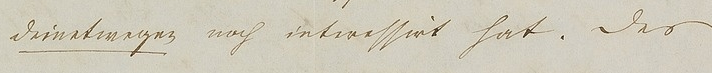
deinetwegen noch interessiert hat. Des
